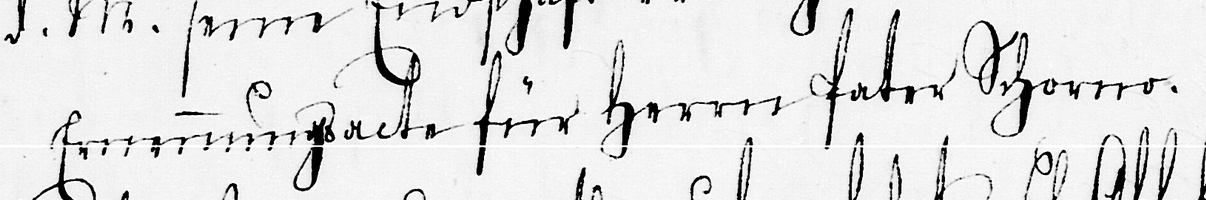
Ernennungsacte für Herrn Pater Schorno.
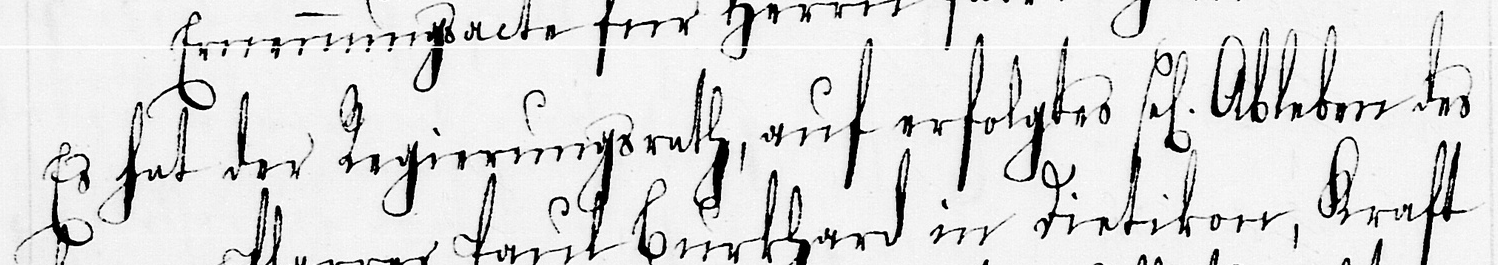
Es hat der Regierungsrath, auf erfolgtes sel. Ableben
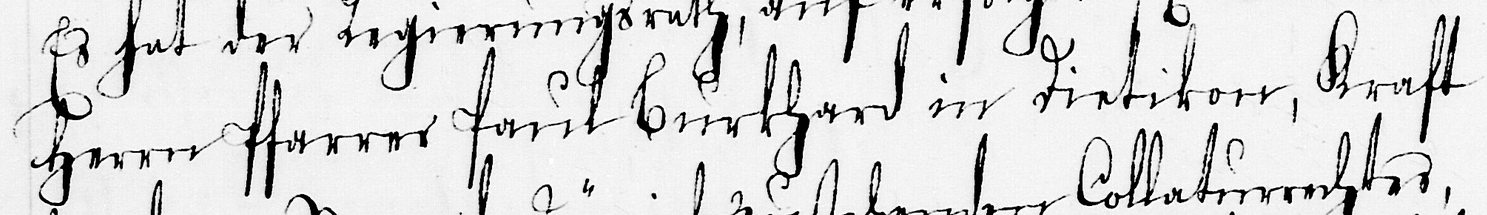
Herrn Pfarrer Paul Burkhard in Dietikon, Kraft
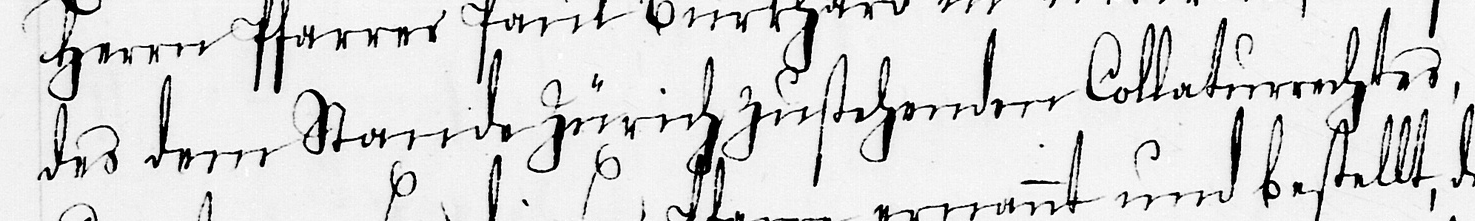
des dem Stande Zürich zustehenden Collaturrechtes,
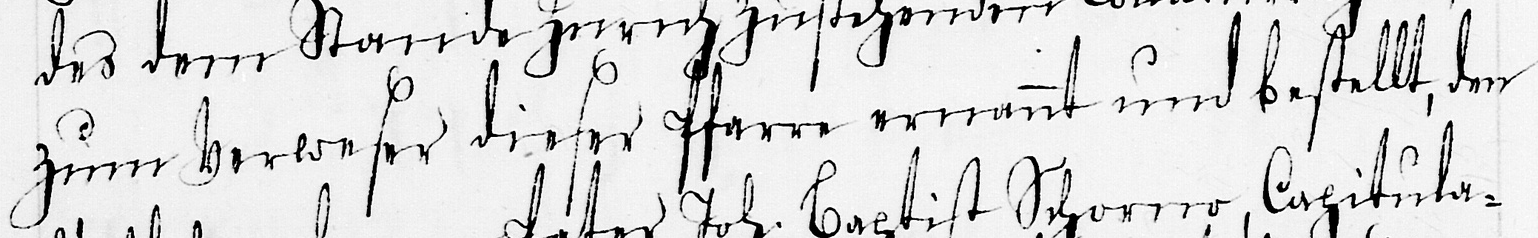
zum Verweser dieser Pfarre ernannt und bestellt, den
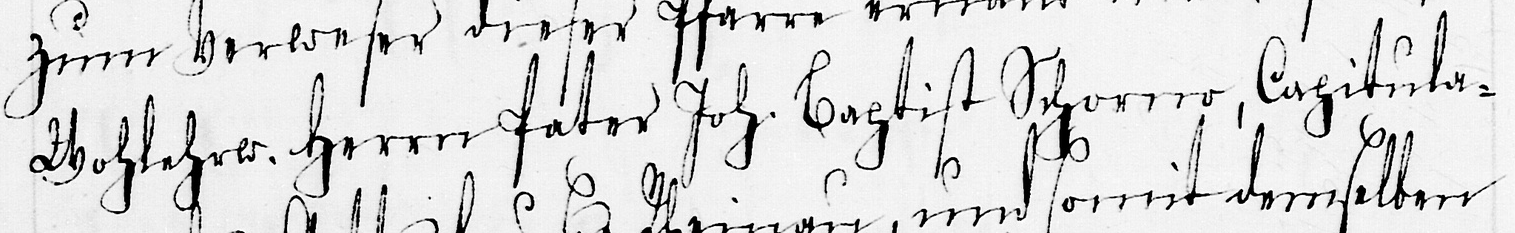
Wohlehrw. Herrn Pater Joh. Baptist Schorno, Capitula¬
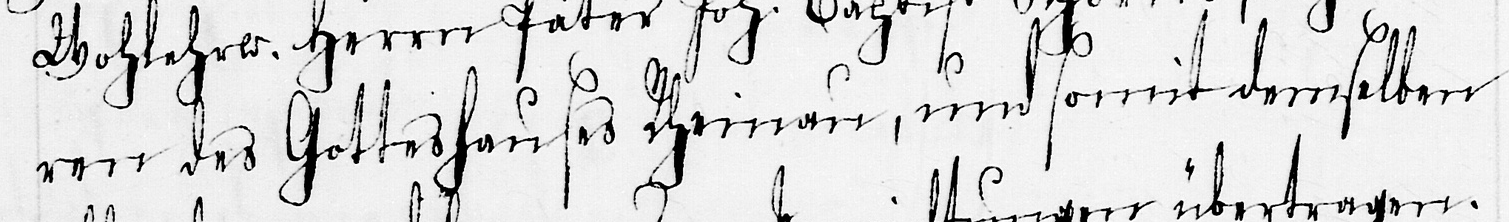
ren des Gotteshauses Rheinau, und somit demselben
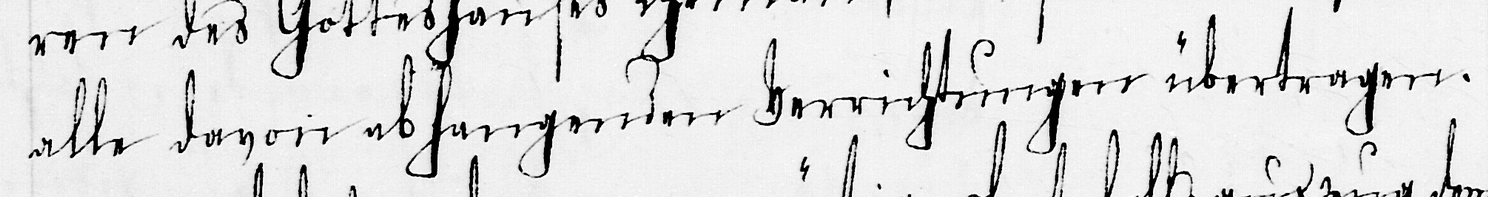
alle davon abhangenden Verrichtungen übertragen.
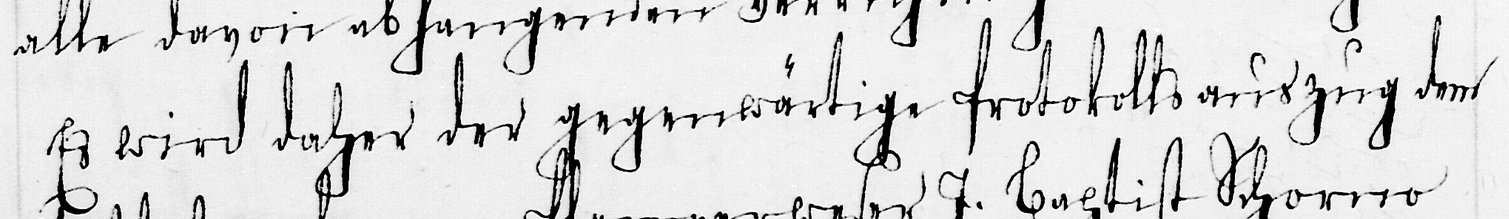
Es wird daher der gegenwärtige Protokollsauszug dem
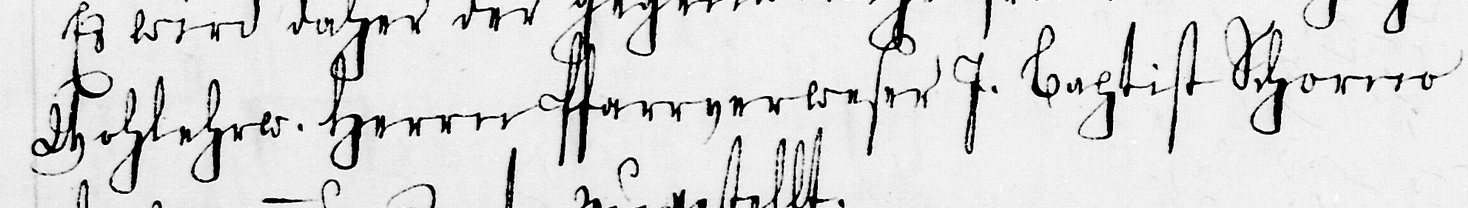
Wohlehrw. Herrn Pfarrverweser J. Baptist Schorno
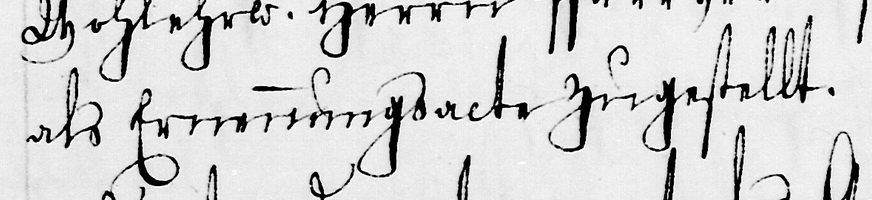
als Ernennungsacte zugestellt.
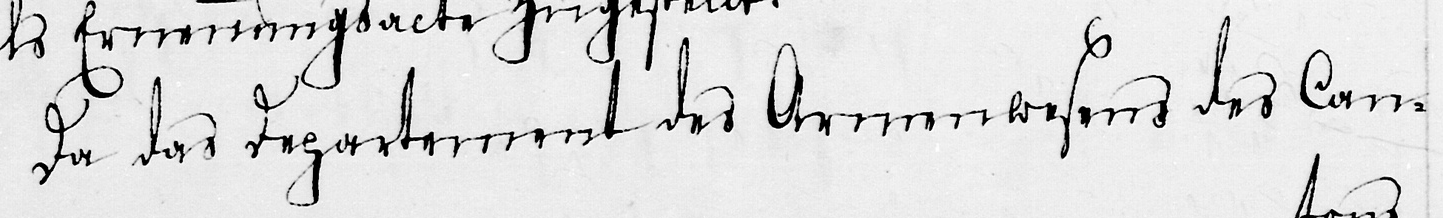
Da das Departement des Armenwesens des Can-
